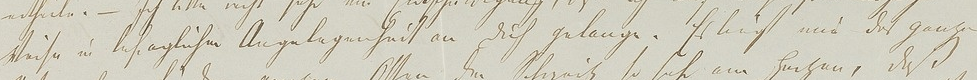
Weise in befraglicher Angelegenheit an Dich gelange. Es liegt mir das ganze
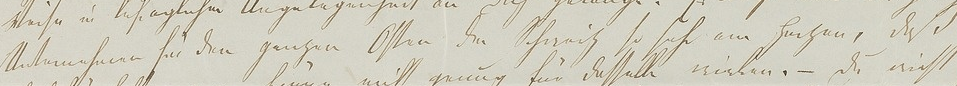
Unternehmen für den ganzen Osten der Schweiz so sehr am Herzen, daß
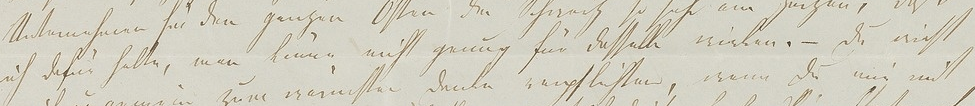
ich dafür halte, man könne nicht genug für dasselbe wirken. – Du wirst
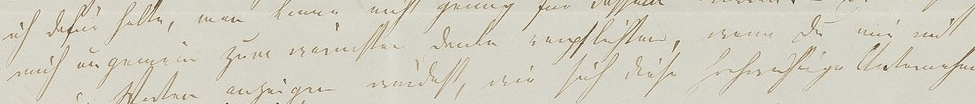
mich ungemein zum wärmsten Danke verpflichten, wenn Du mir mit
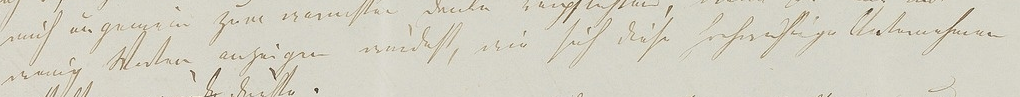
wenig Worten anzeigen würdest, wie sich diese hochwichtige Unternehmen
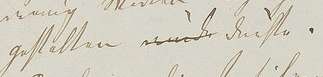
gestalten würde dürfte.
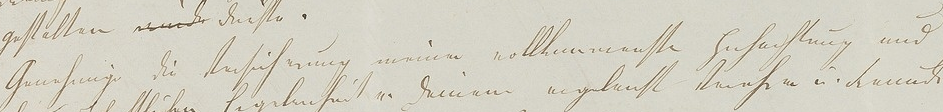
Genehmige die Versicherung meiner vollkommenen Hochachtung und
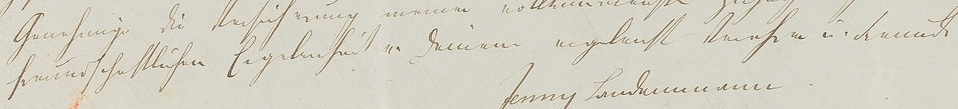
freundschaftlichen Ergebenheit v. Deinem ergebensten Verehrer u. Freunde
